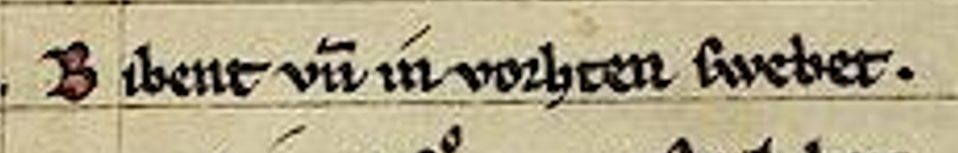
Bibent vn(d) in vorhten ſwebet.
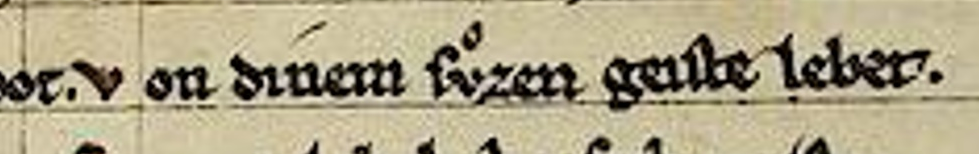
Von dinem ſv°ozen geiſte lebet.
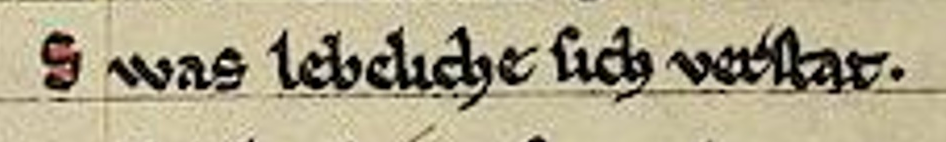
Swas lebeliche ſich verſtat.
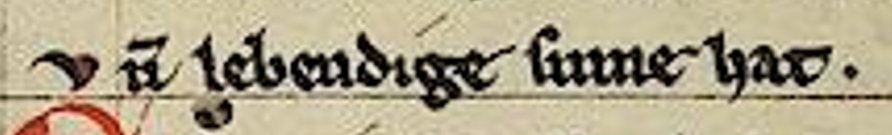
Vn(d) lebendige ſinne hat.
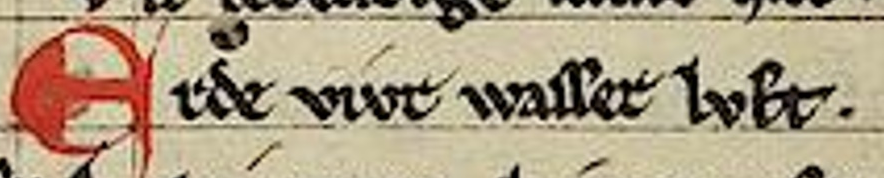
*Erde vivr waſſer lvft.
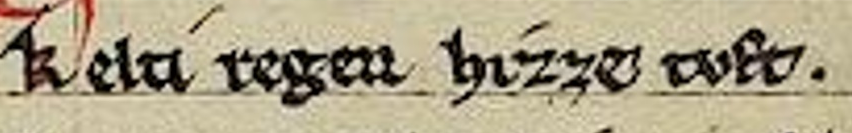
Kelti regen hizze tvft.
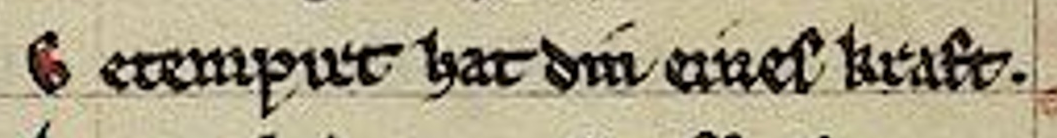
Getempirt hat din eineſ kraft.
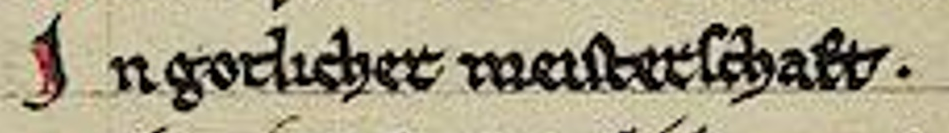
In gotlicher meiſterſchaft.
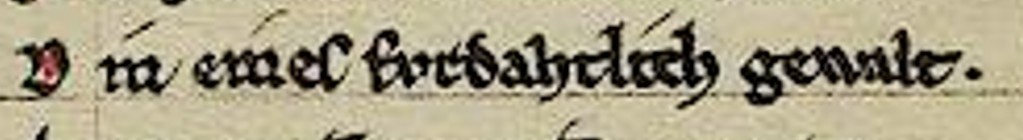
Din eineſ fvrdahtlich gewalt.
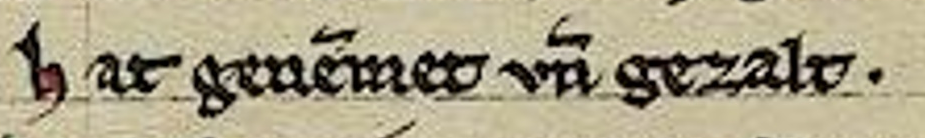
Hat gene(m)met vn(d) gezalt.
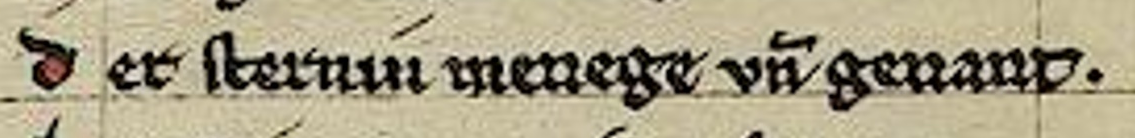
Der ſternin menege vn(d) genant.
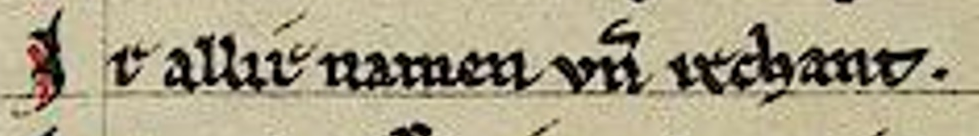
Ir allir namen vn(d) irchant.
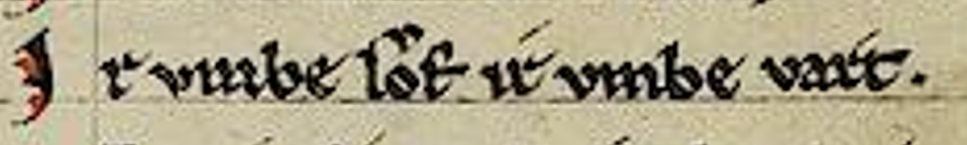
Ir vmbe lo°vf ir vmbe vart.
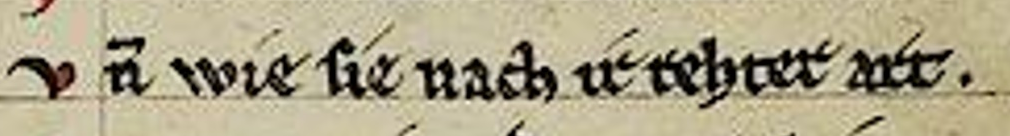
Vn(d) wie ſie nach ir rehter art.
